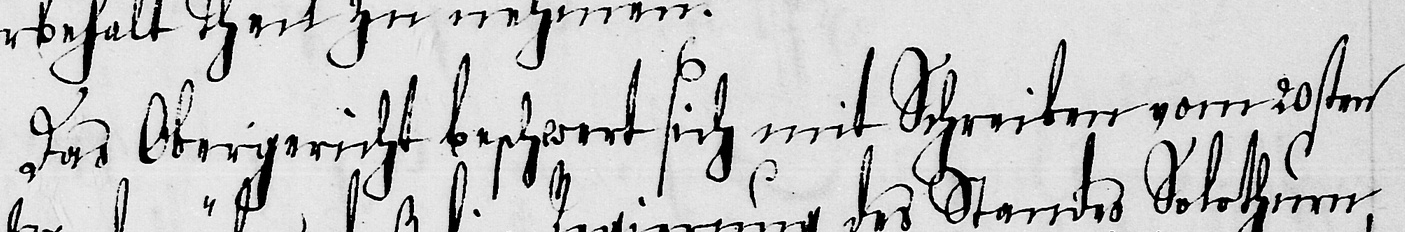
Das Obergericht beschwert sich mit Schreiben vom 20sten
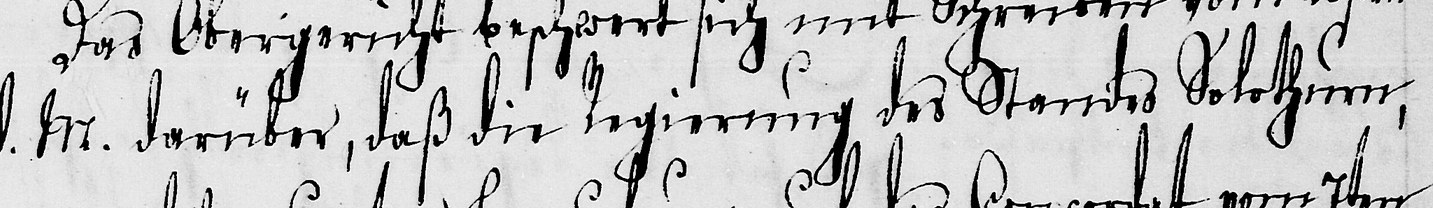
M. darüber, daß die Regierung des Standes Solothurn,
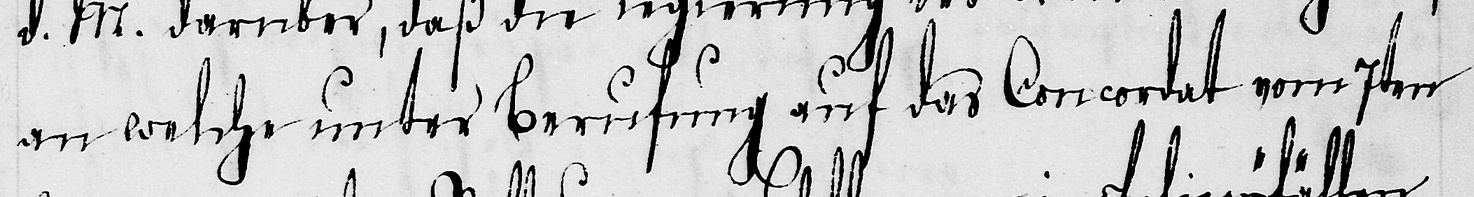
an welche unter Berufung auf das Concordat vom 7ten
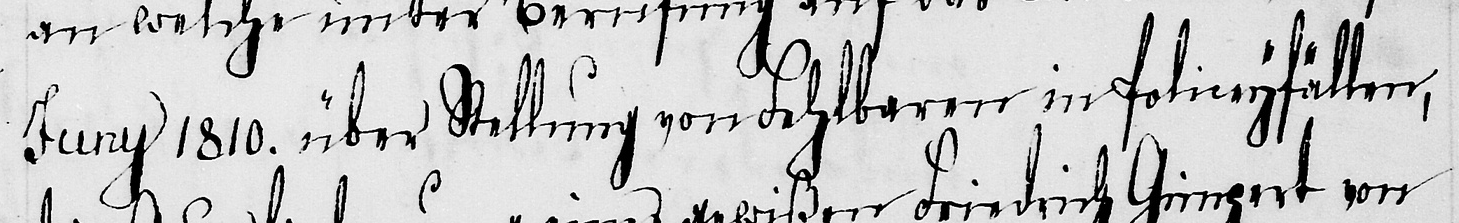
Juny 1810. über Stellung von Fehlbaren in Policeyfällen,
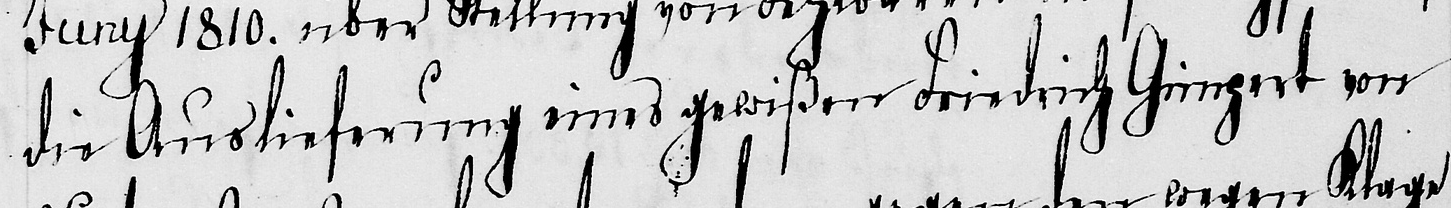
die Auslieferung eines gewißen Friedrich Gingert von
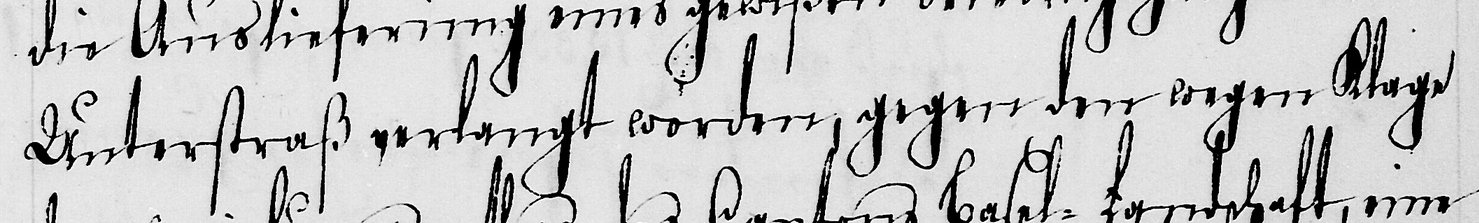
Unterstraß verlangt worden, gegen den wegen Klage
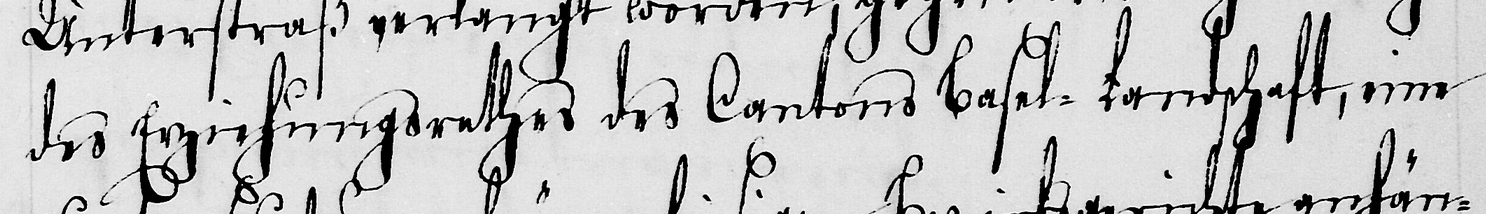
des Erziehungsrathes des Cantons Basel-Landschaft, eine
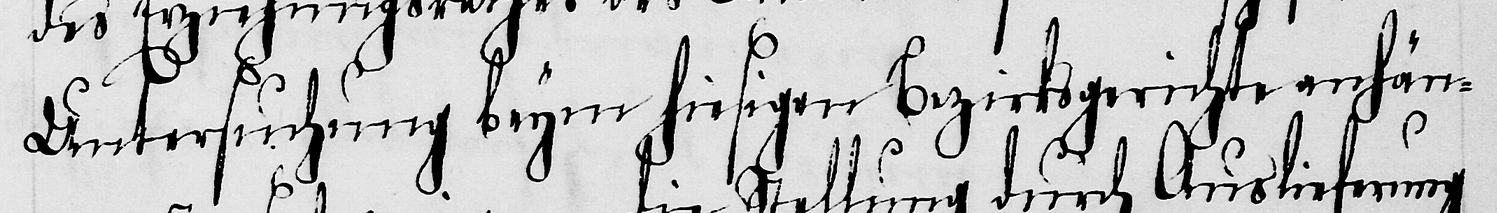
Untersuchung beym hiesigen Bezirksgerichte anhän¬
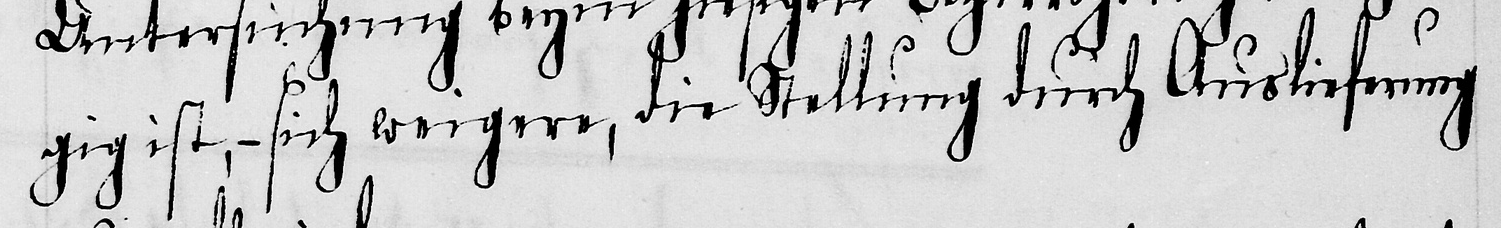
gig ist, – sich weigere, die Stellung durch Auslieferung
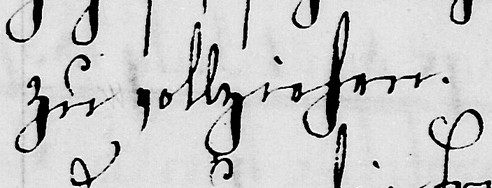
zu vollziehen.
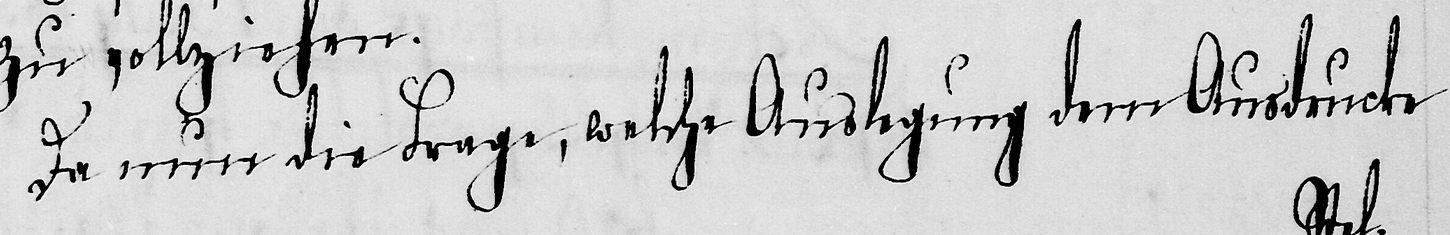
Da nun die Frage, welche Auslegung dem Ausdrucke
